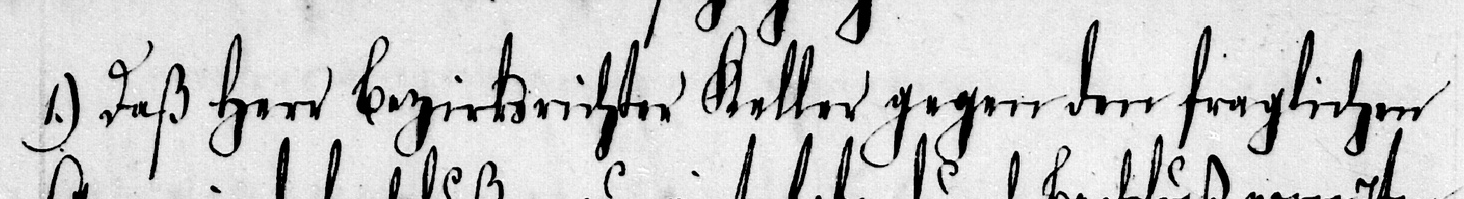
1.) Daß Herr Bezirksrichter Keller gegen den fraglichen
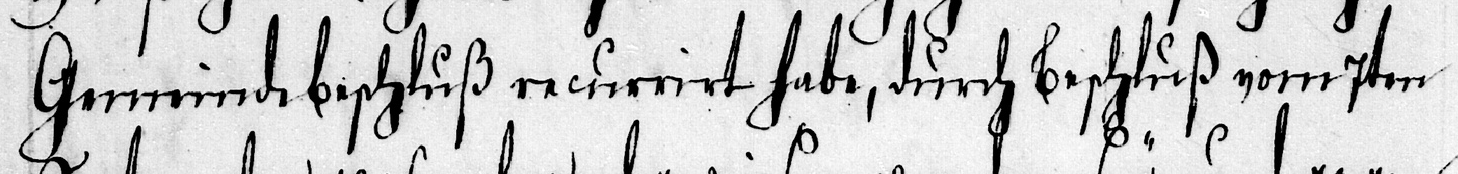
Gemeindebeschluß recurrirt habe, durch Beschluß vom 7ten
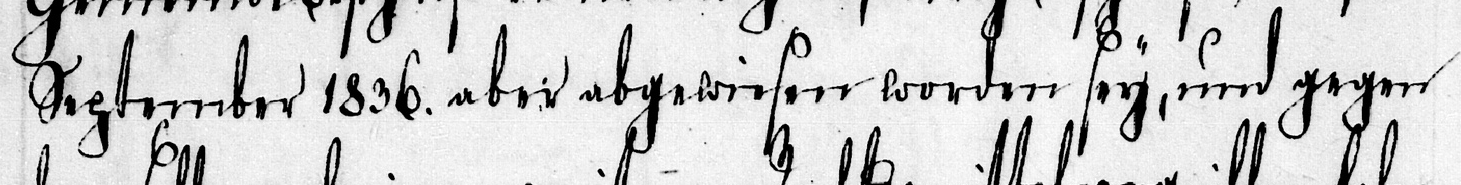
September 1836. aber abgewiesen worden sey, und gegen
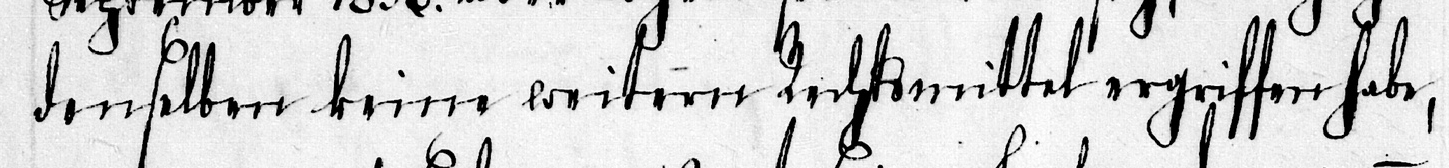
denselben keine weitern Rechtsmittel ergriffen habe,
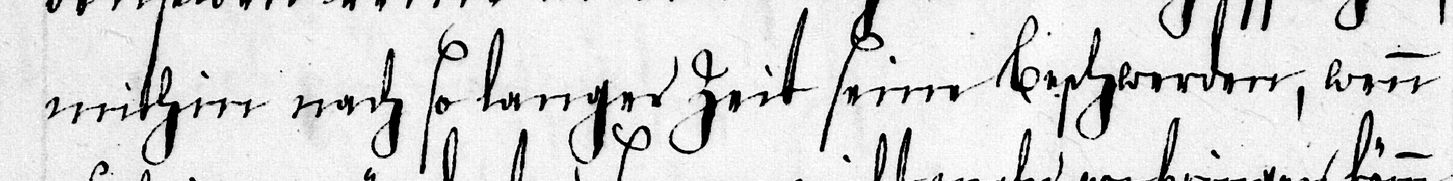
mithin nach so langer Zeit seine Beschwerden, wenn
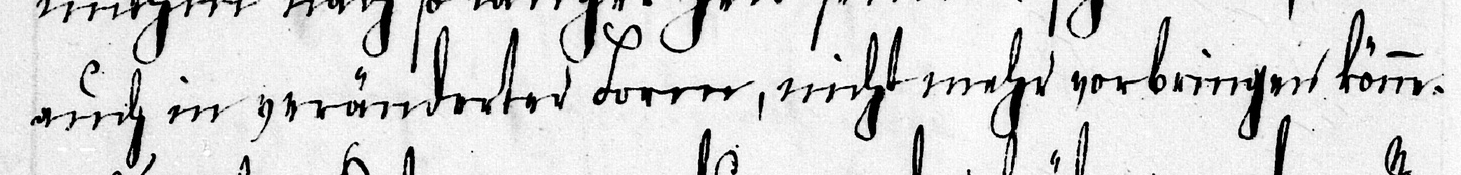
auch in veränderter Form, nicht mehr vorbringen könne.
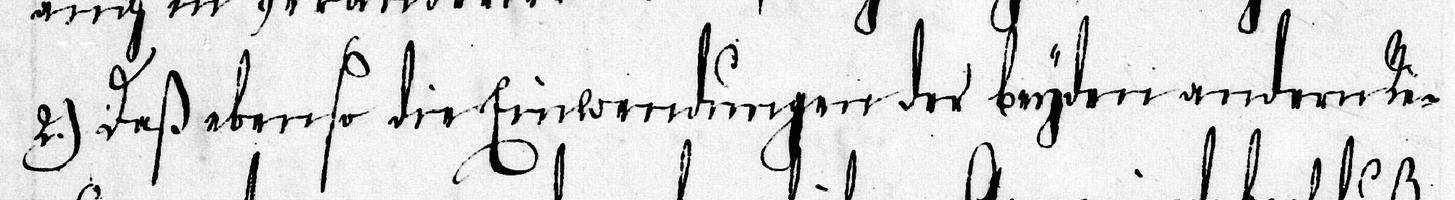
2.) Daß ebenso die Einwendungen der beyden andern Re¬
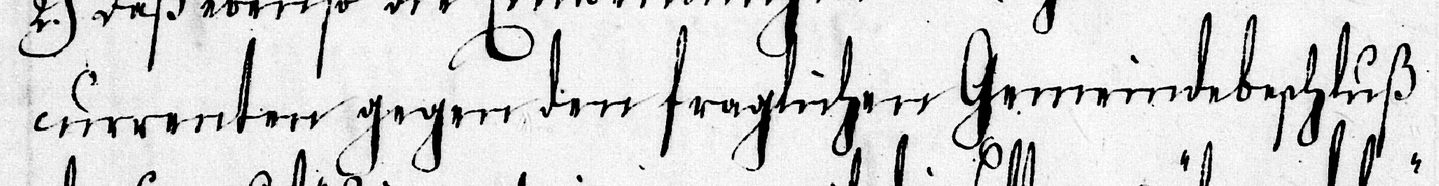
currenten gegen den fraglichen Gemeindebeschluß
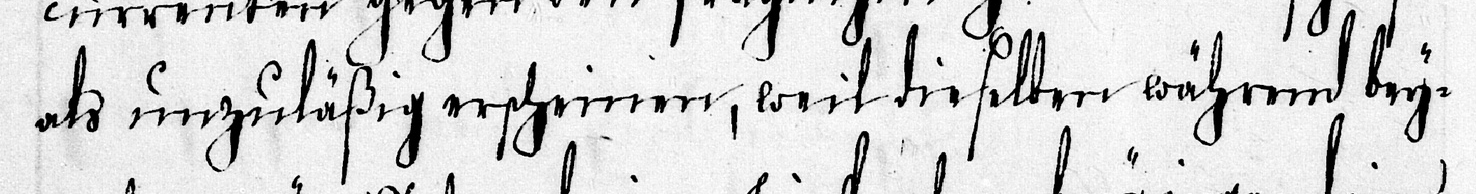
als unzuläßig erscheinen, weil dieselben während bey¬
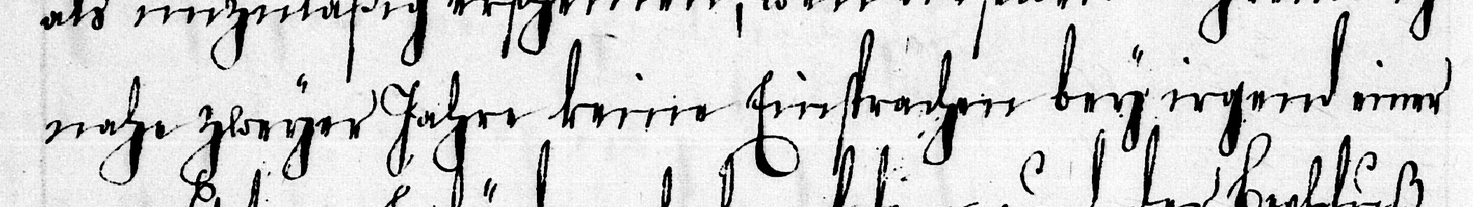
nahe zweyer Jahre keine Einsprachen bey irgend einer
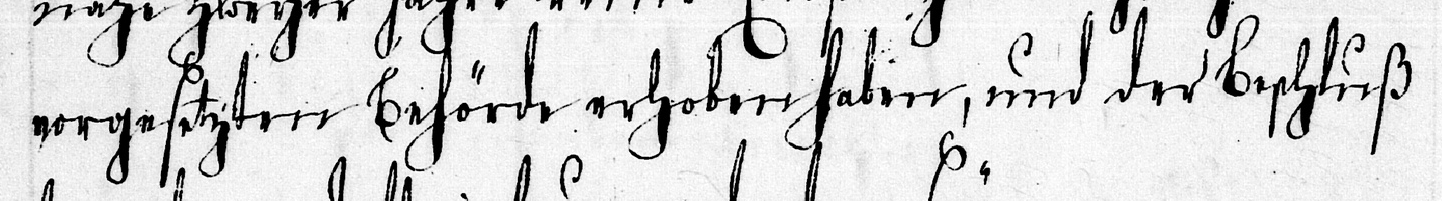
vorgesetzten Behörde erhoben haben, und der Beschluß
